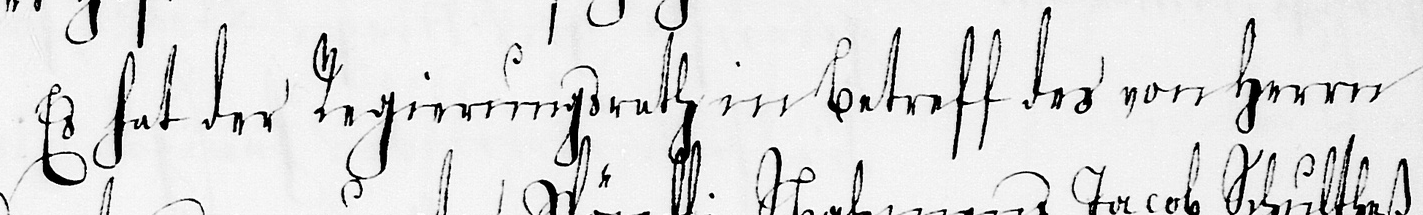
Es hat der Regierungsrath in Betreff des von Herrn
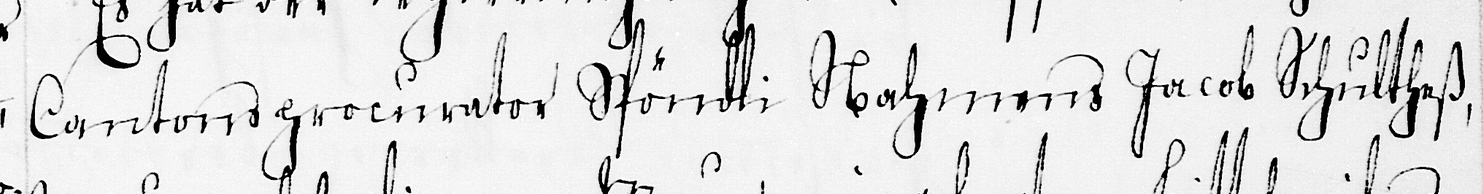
Cantonsprocurator Spöndli Nahmens Jacob Schultheß,
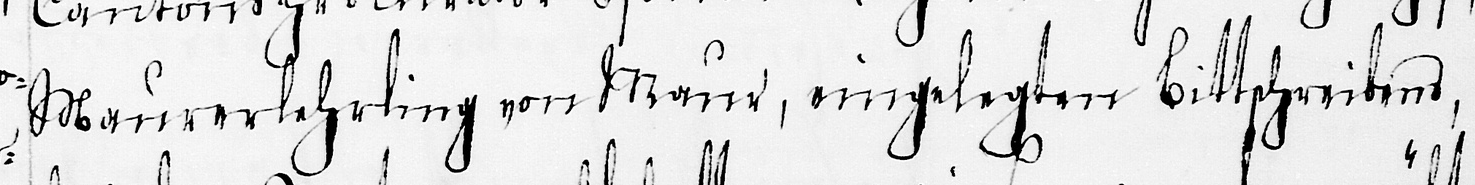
Maurerlehrling von Maur, eingelegten Bittschreibens,
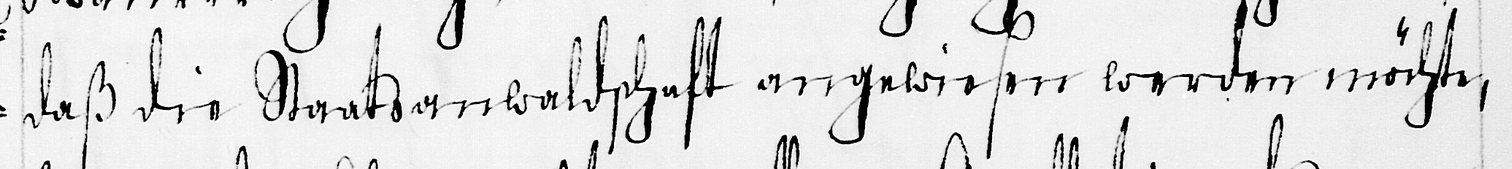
daß die Staatsanwaldschaft angewiesen werden möchte,
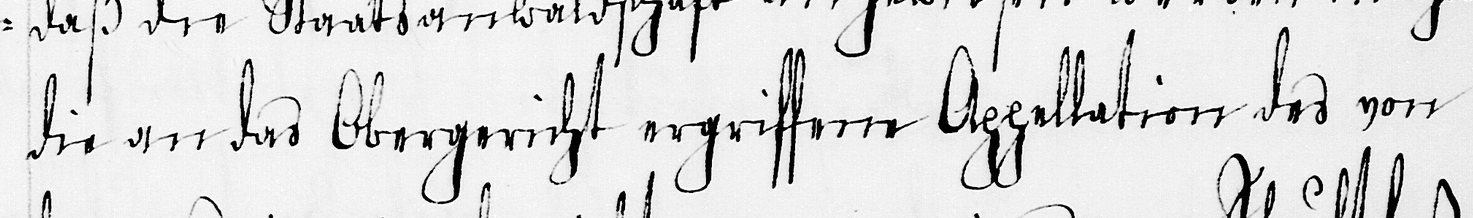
die an das Obergericht ergriffene Appellation des von
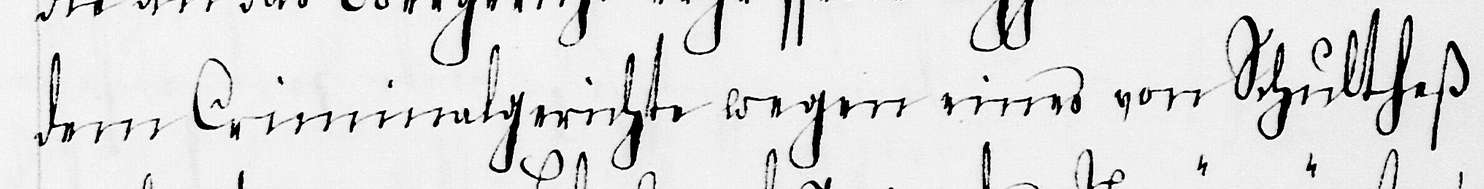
dem Criminalgerichte wegen eines von Schultheß
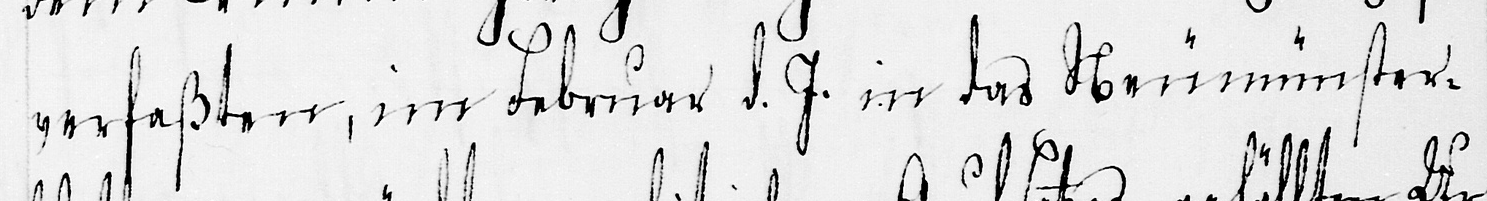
verfaßten, im Februar d. J. in das Neumünster¬
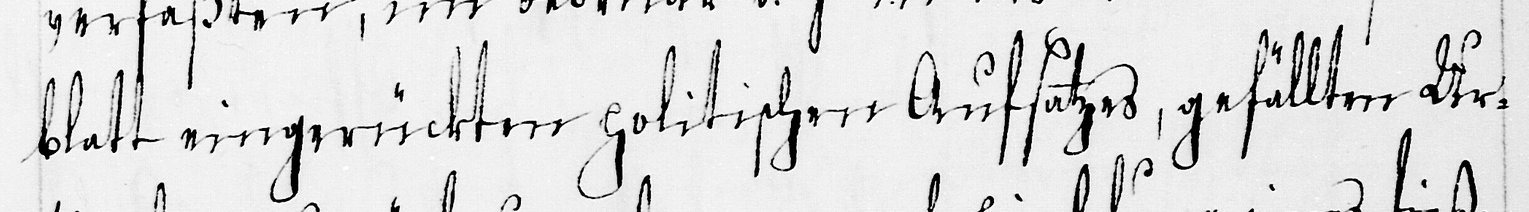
blatt eingerückten politischen Aufsatzes, gefällten Ur¬
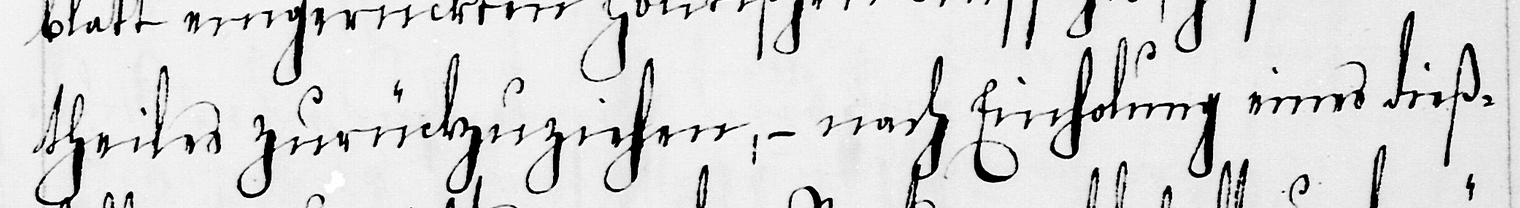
theiles zurückzuziehen, − nach Einholung eines dieß¬
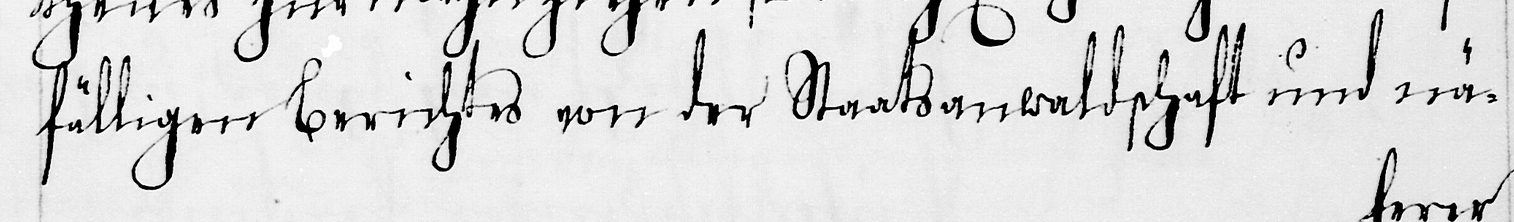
fälligen Berichtes von der Staatsanwaldschaft und nä-
